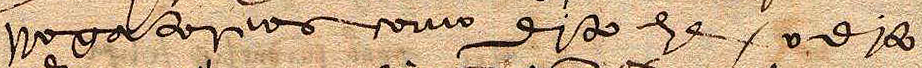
rrogatoreos como djto he / o djto
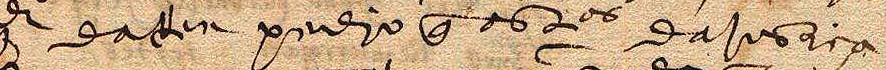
ꝓdor da Ree pedjo q̄ as tas da Justiça
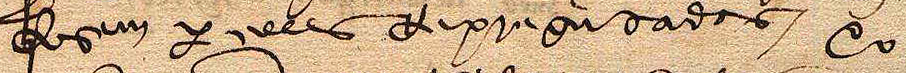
fosem ꝑ elles Repregūtadas / e o
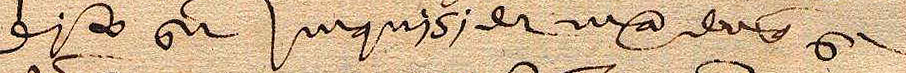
djto sōr Jmqujsjdor mādou q̄ se
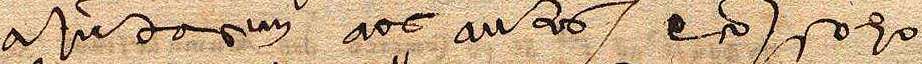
aJūtasem aos autos / e c̄o Jso ho
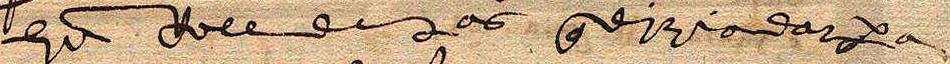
hū Roll de tas q̄ djzia dar ꝑa
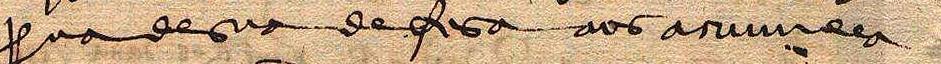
ꝓua de sua defesa aos acumulla
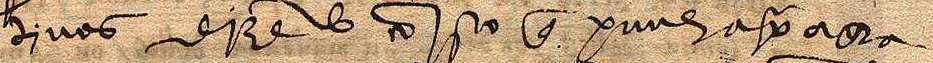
tjuos djzēdo c̄o Jso q̄ punha p̄ agra
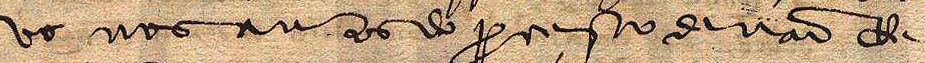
vo nos autos do ꝓçesso de não Re
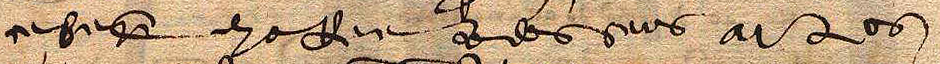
çeberē ha Ree todos seus artos
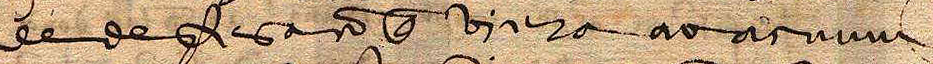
de defesa cō q̄ vjera ao acumu
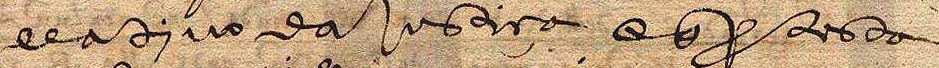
llatjuo da Justiça e q̄ ꝓtesta
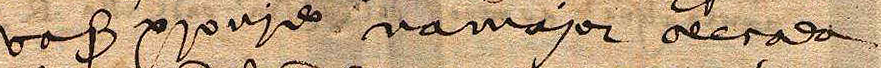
va ꞩ proujdo na major allçada
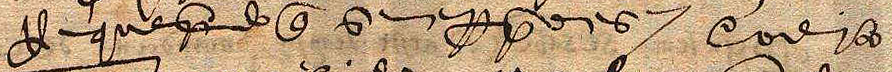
Requerēdo q̄ se estp̄vese / e o djto
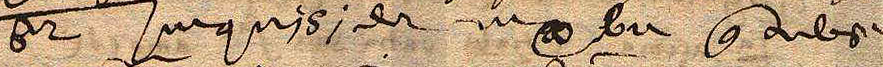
Sōr Jmqujsjdor mādou q̄ tudo se
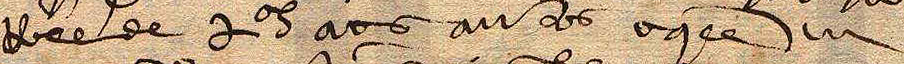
Roll de tas aos autos o q̄ll eu
